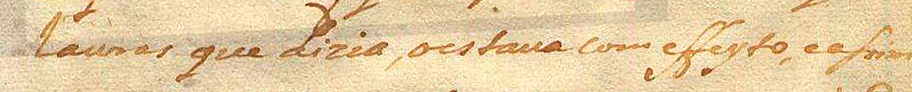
lauras que dizia, o estaua com effeyto, e assim
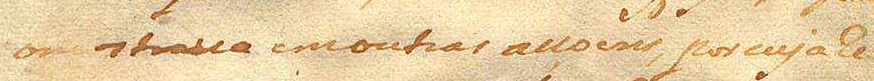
o mostraua em outras acçoens, por cuja Re
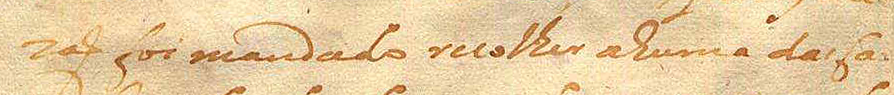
zaõ foi mandado recolher a huma das Ca
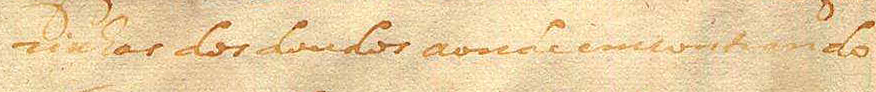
zinhas dos doudos aonde emcontrando
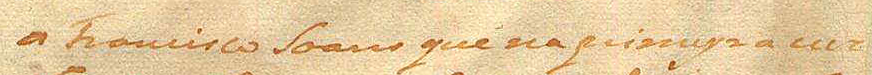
a Francisco Soares que na primeyra uez
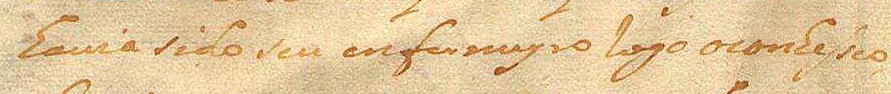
hauia sido seu enfermeyro logo o conhesseo,
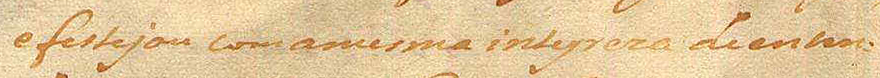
e festejou com a mesma inteyreza de enten
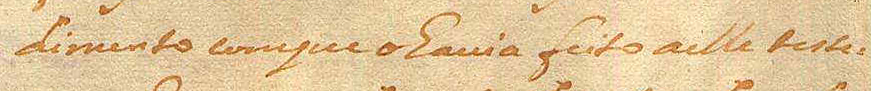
dimento com que o hauia feito a elle teste
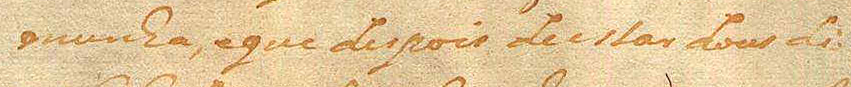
munha, e que despois de estar dous di
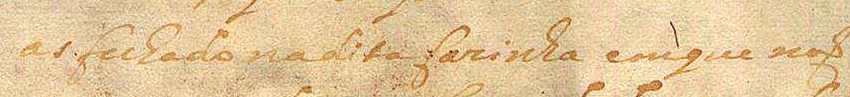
as fechado na dita Cazinha em que naõ
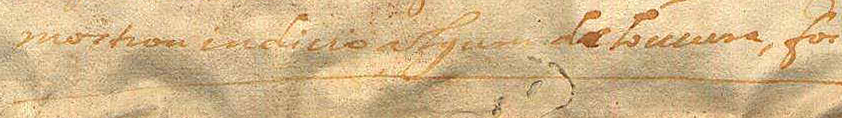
mostrou indicio algum de loucura, foi
